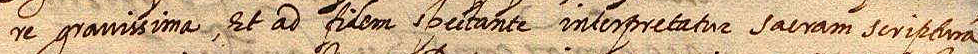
re grauissima, Et ad fidem spectante interpretatur sacram scripturā
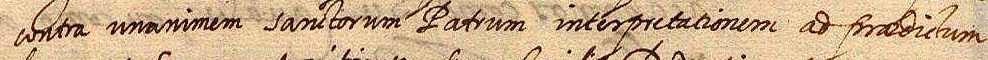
contra unanimem sanctorum Patrum interpretationem ad prædictum
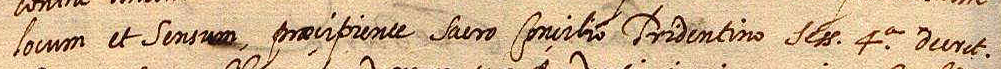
locum et sensum, præcipiente sacro Concilio Tridentino sess. 4.a decret.
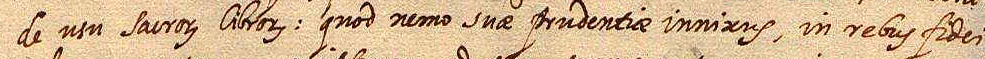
de usu sacroꝵ libroꝵ: quod nemo suæ prudentiæ innixus, in rebus fidei
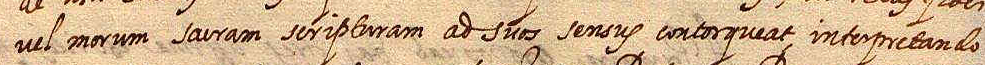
uel morum sacram scripturam ad suos sensus contorqueat interpretando
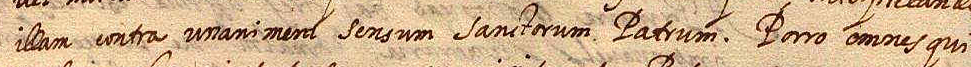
illam contra unanimen sensum Sanctorum Patrum. Porro omnes qui
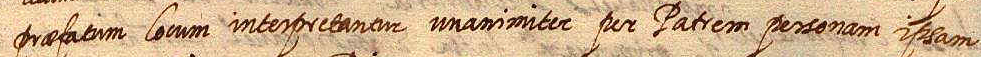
præfatum locum interpretantur unanimiter per Patrem personam ipsam
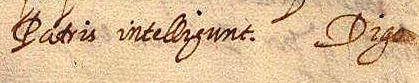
Patris intelligunt. Digo
